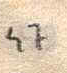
47
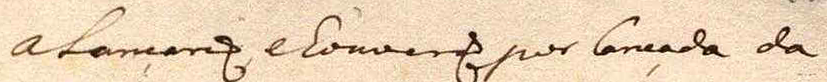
a Lançaraõ, e houverõ por lançada da
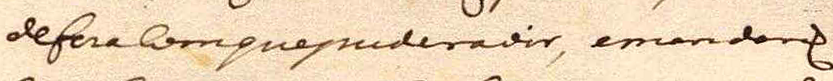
defeza com que pudera vir, e mandaraõ
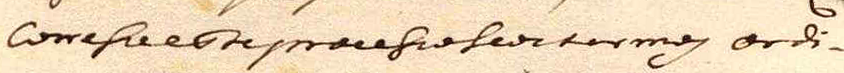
corresse este processo seos termos ordi
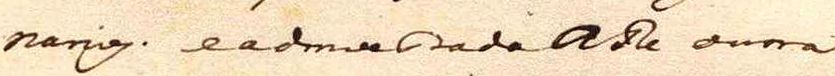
narios. e admoestada a Re outra
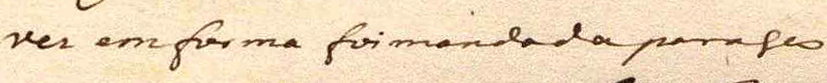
vez em forma foi mandada para seo
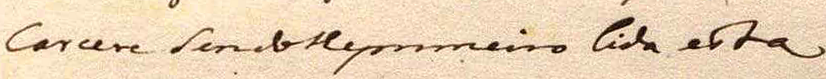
Carcere sendolhe primeiro lida esta
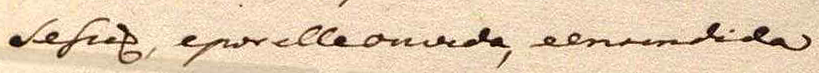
sessaõ, e por elle ouvida, e entendida
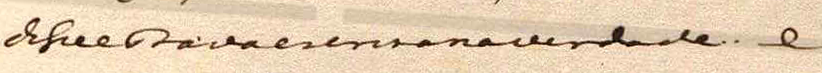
disse estava escrita na verdade. e
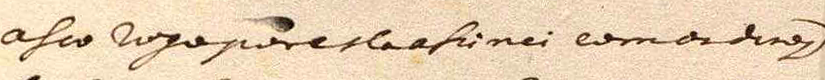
a seo Rogo por ella asinei com os ditos
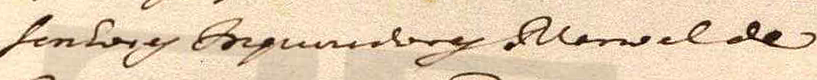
senhores Inquizidores Manoel de
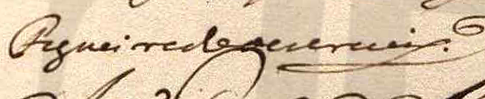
Fegueiredo o escreuy.
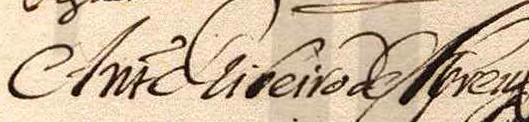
Anto Ribeiro de Abreu
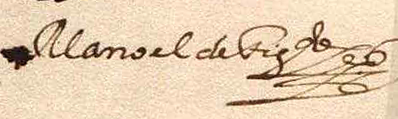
Manoel de Figdo
